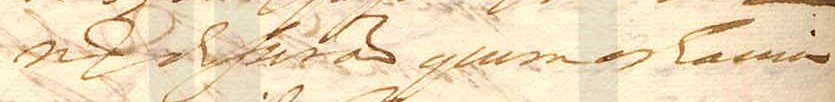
naõ diseraõ quem os hauia
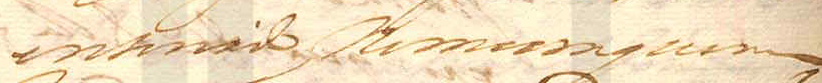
ensinado, nem com quem
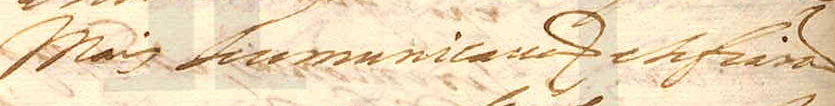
mais se comunicauaõ, e se fiaraõ
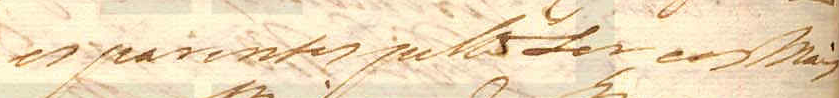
os parentes pello ter e os mais
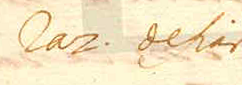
Raz. de fiar
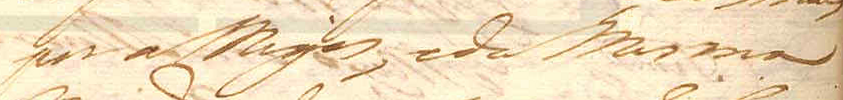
por amigos, e da mesma
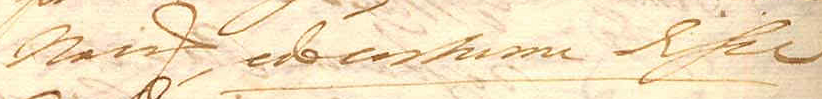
naçaõ, e do costume disse
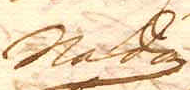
nada
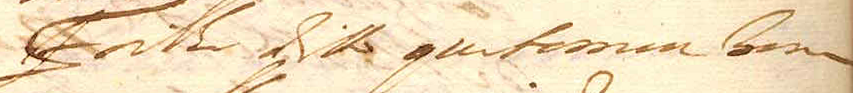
Foilhe ditto que tomou bom
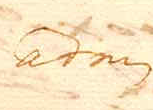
adm
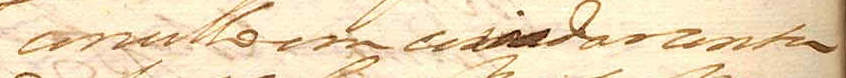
concelho em uir dar conta
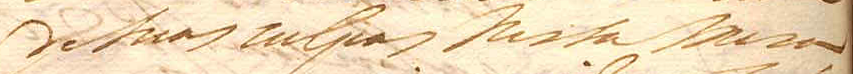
de suas culpas nesta meza
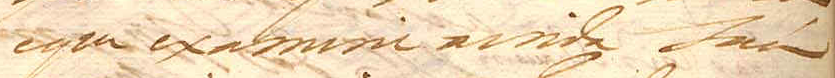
e que examine ainda sua
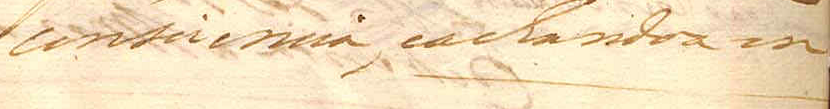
consciencia, e achandoa en
